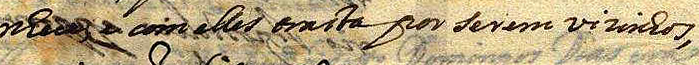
nhece, e com elles tracta por serem vizinhos,
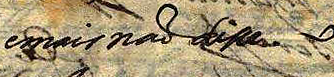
e mais naõ disse -
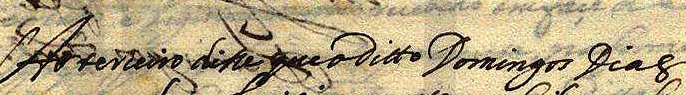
Ao terceiro disse que o ditto Domingos Dias
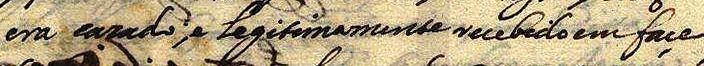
era cazado, e legitimamente recebido em face
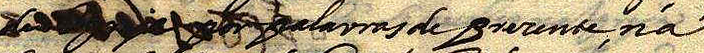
da Igreja e por palavras de prezente, na
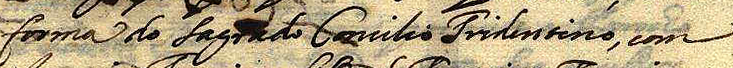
forma do sagrado Concilio Tridentino, com
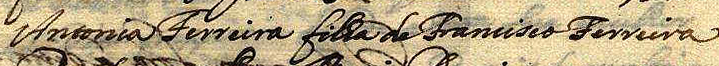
Antonia Ferreira filha de Francisco Ferreira
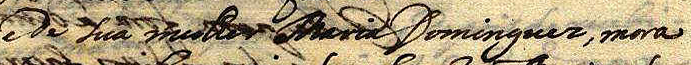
e de sua mulher Maria Dominguez, mora
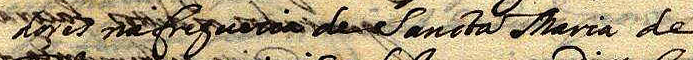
dores na freguezia de Sancta Maria de
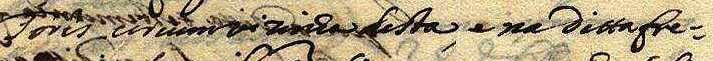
Torês circumvizinha desta, e na ditta fre
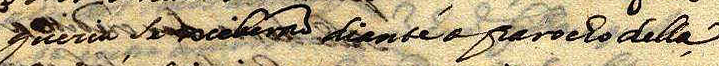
guezia se receberaõ diante o parocho della
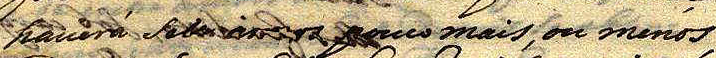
hauerá sete annos pouco mais, ou menos,
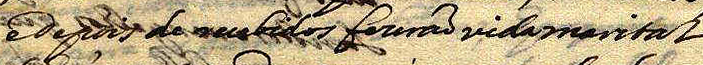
e depois de recebidos fezeraõ vida marital
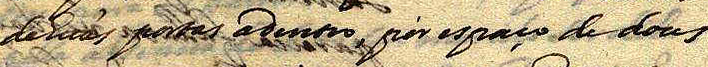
de huās portas adentro, por espaço de dous
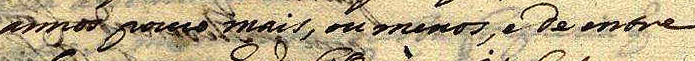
annos pouco mais, ou menos, e de entre
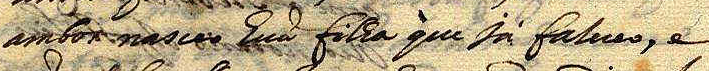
ambos nasceo huā filha que já faleceo, e
